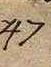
47
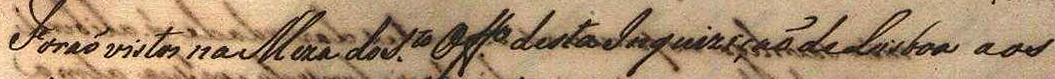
Foraõ vistos na Meza do S.to Off.o desta Inquiziçaõ de Lisboa aos
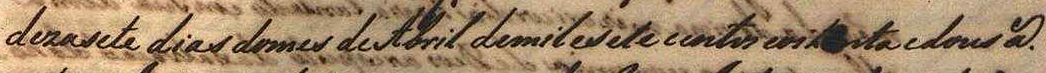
dezasete dias do mes de Abril de mil e setecentos e oitenta e dous ā
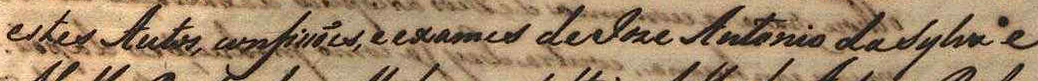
estes Autos, confissões, e exames de Ioze Antonio da Sylva e
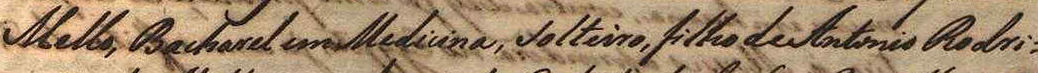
Mello, Bacharel em Medicina, solteiro, filho de Antonio Rodri
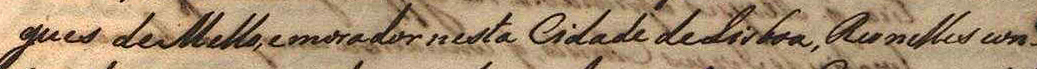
gues de Mello, e morador nesta Cidade de Lisboa, Reo nelles con
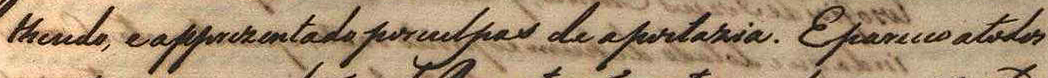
theudo, e apprezentado por culpas de apostazia. E pareceo a todos
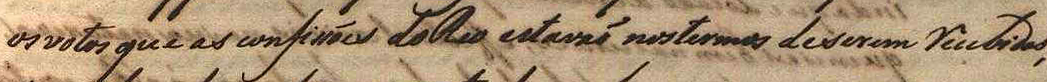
os votos que as confissões do Reo estavaõ nos termos de serem recebidas,
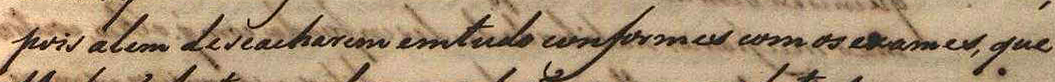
pois alem de se acharem em tudo conformes com os exames, que
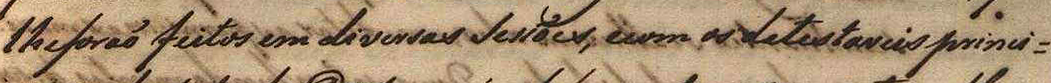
lhe foraõ feitos em diversas sessões, e com os detestaveis princi
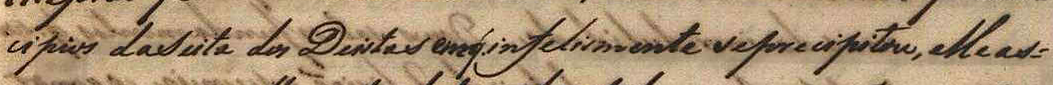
cipios da seita dos Deistas em q̄ infelismente se precipitou, elle as
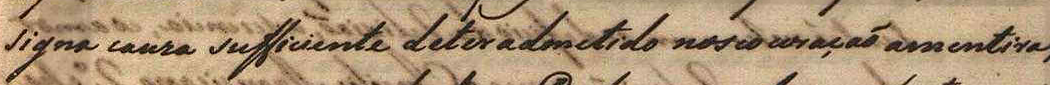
signa cauza sufficiente de ter admetido no seo coraçaõ a mentira,
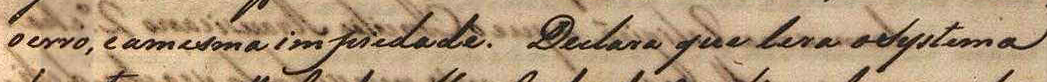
o erro, e a mesma impiedade. Declara que hera o Systema
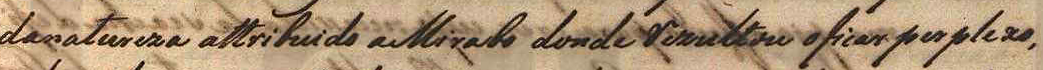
da natureza attribuido a Mirabo donde rezultou o ficar perplexo,
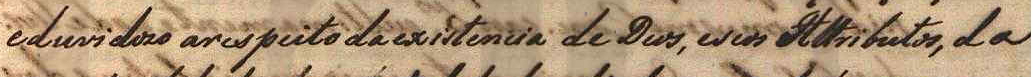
e duvidozo a respeito da existencia de Deos, e seos Altributos, da
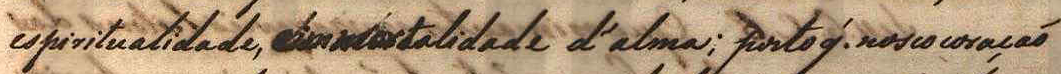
espiritualidade, e imortalidade d'alma; posto q̄ nosso coraçaõ
